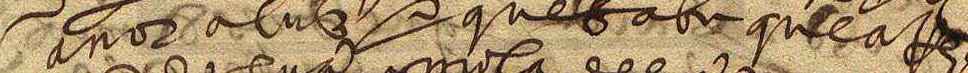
anor aluz̄ e que sabe que a Rhe
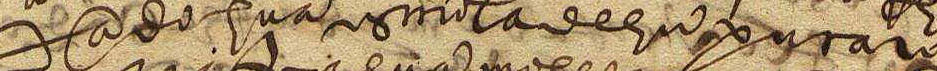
dādo huā esmola de hū pucaro
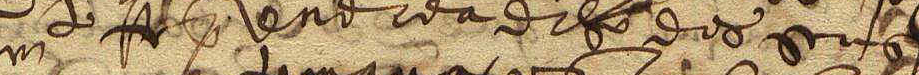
mto Reprendida diso dos seus
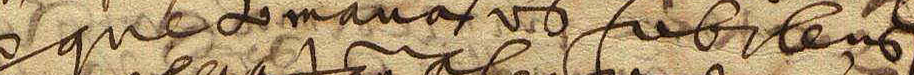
e que tomaua os Jubileus
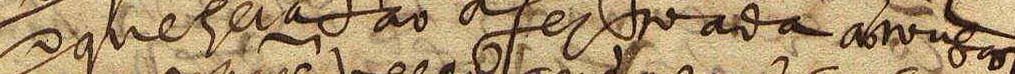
e que hera tão afejçoada as cousas
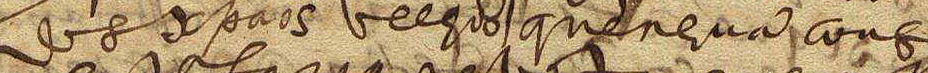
dos xpãos velhos que nhuā cousa
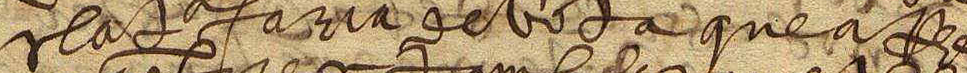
ela ta fazia devota que a Rhe
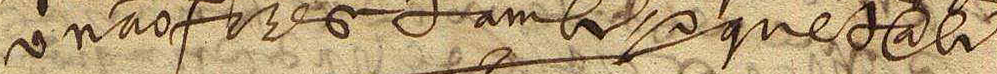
o não fezese tambē / e que tābē
